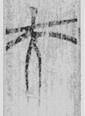夫
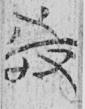○（詩）
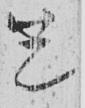也
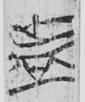者
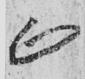㠯（以）
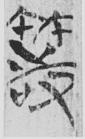{竹口寺}（誌）
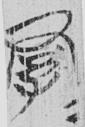君子
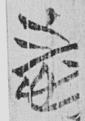之心
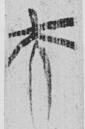夫
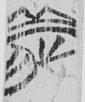義
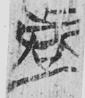者
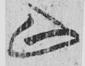㠯（以）
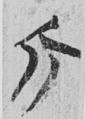斤（謹）
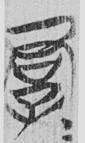君子
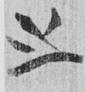之
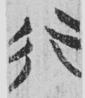行
